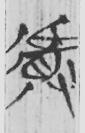虘B
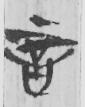言
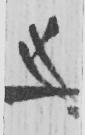之
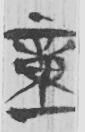童
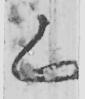㠯（以）
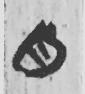目
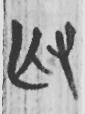{亡又}
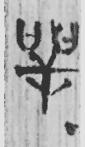咢
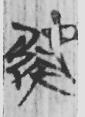{弓夬矢}
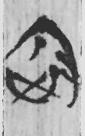禽
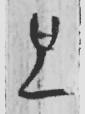也
